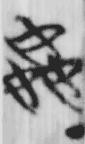姦（奸）
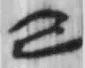己
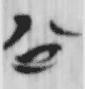公
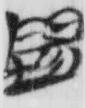○（陽）
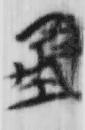堆
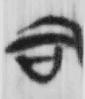司
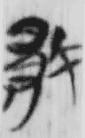敗
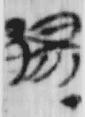○（陽）
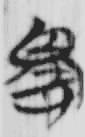愄（威）
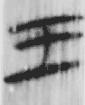王
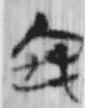○（坉）
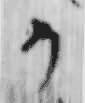人
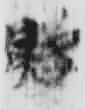戕
